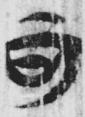可
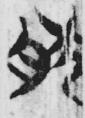肰（然）
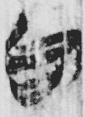句（後）
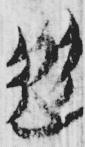從
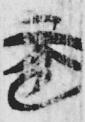而
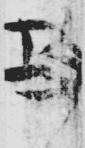攻
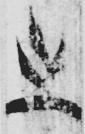之
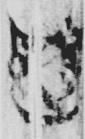○（徵）
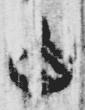自
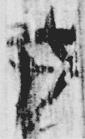戎
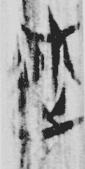述（遂）
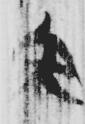内（入）
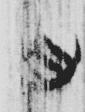自
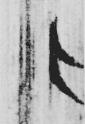北
